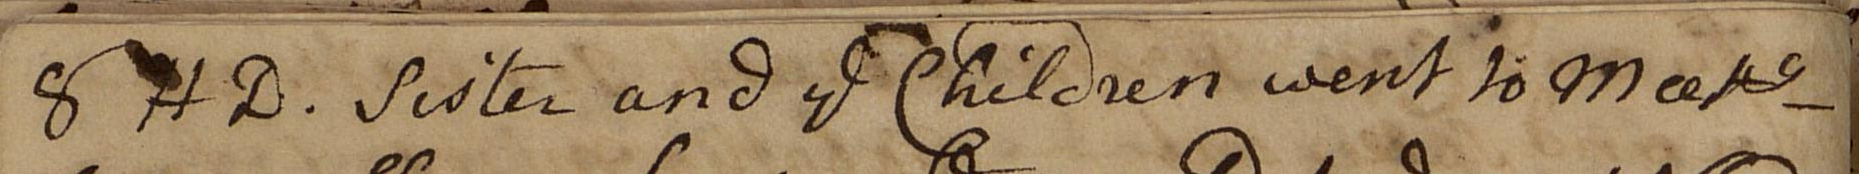8 HD sister and y^e Children went to Meet^g-
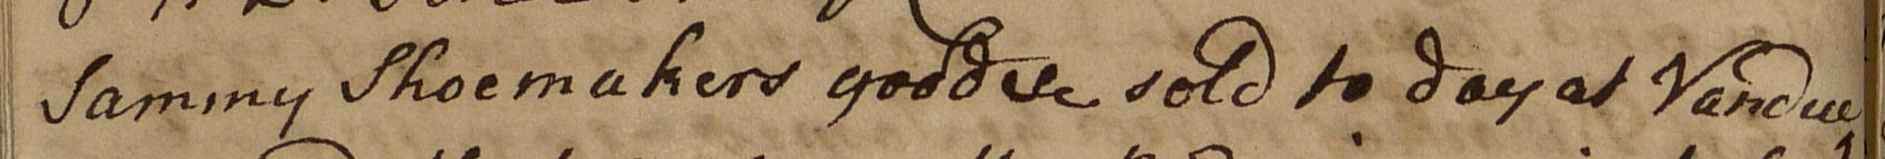Sammy Shoemakers goed &c sold to day at Vandue
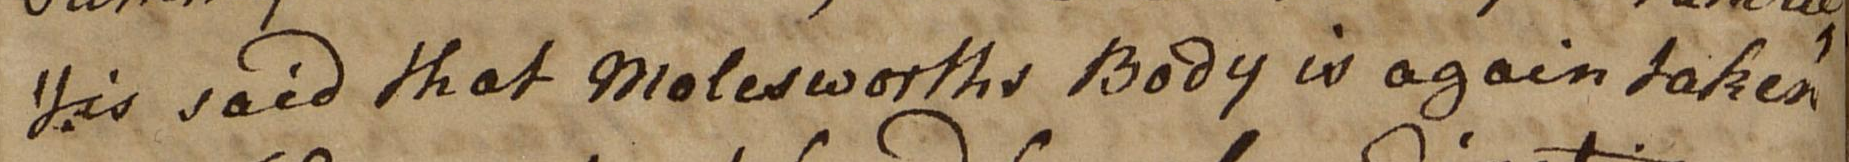'tis said that Molesworths Body is again taken
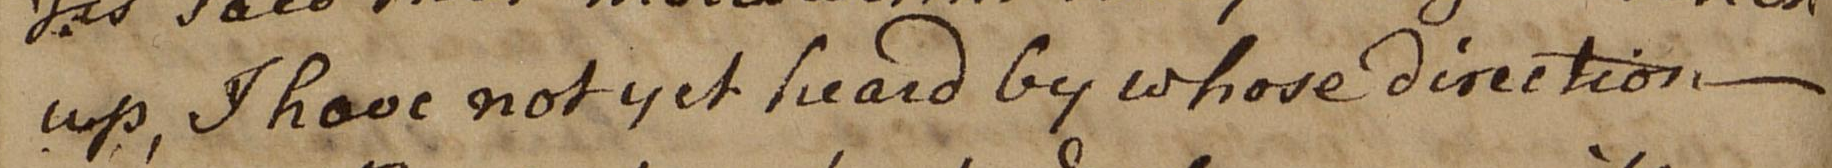up, I have not yet heard by whose direction-
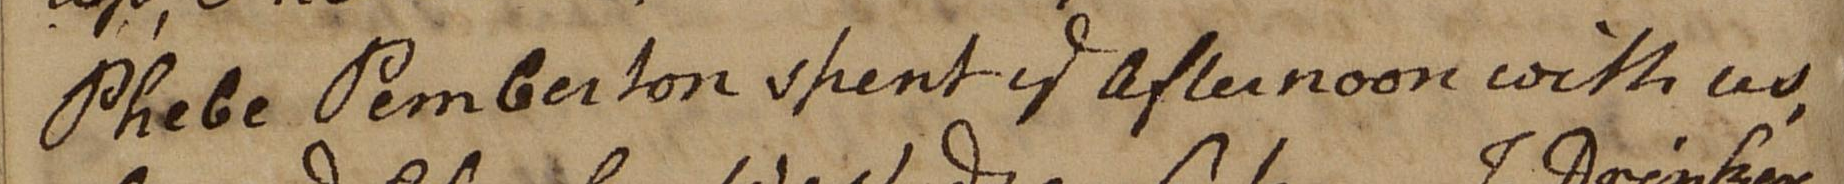Phebe Pemberton spent y^e afternoon with us,
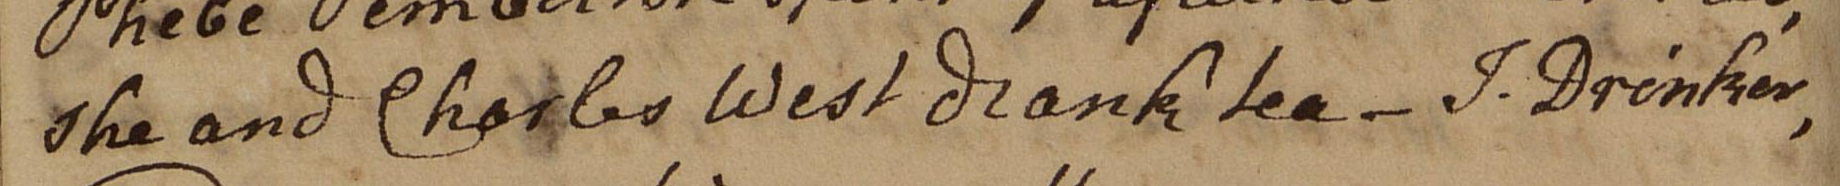she and Charles West drank tea- J. Drinker
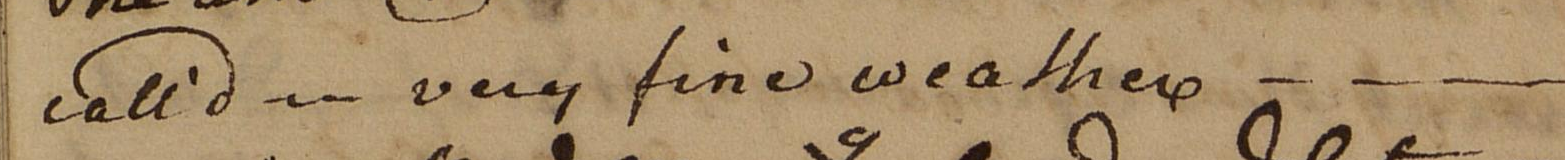call'd- very fine weather---
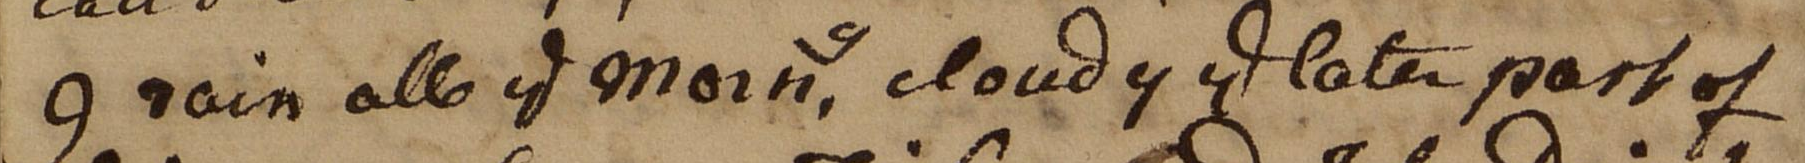9 rain all y^e Morn^g, cloudy y^t later part of
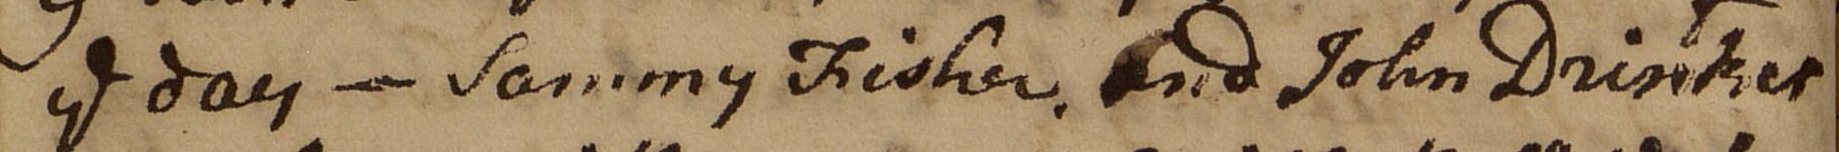y^e day- Sammy Fisher, and John Drinker
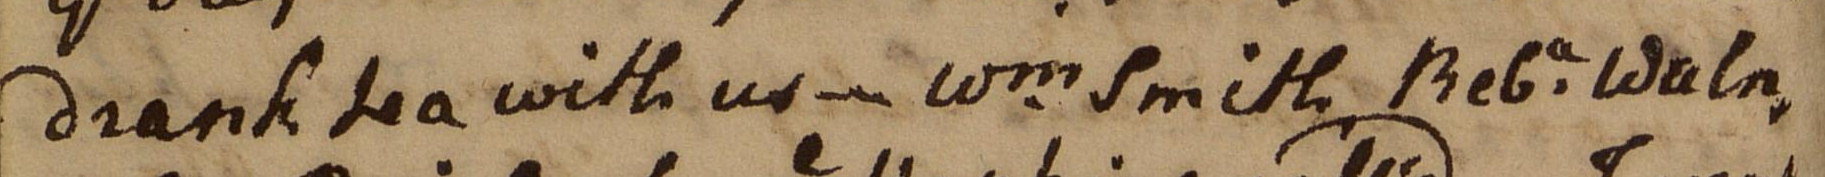drank tea with us- W^m. Smith, Reb^a Waln,
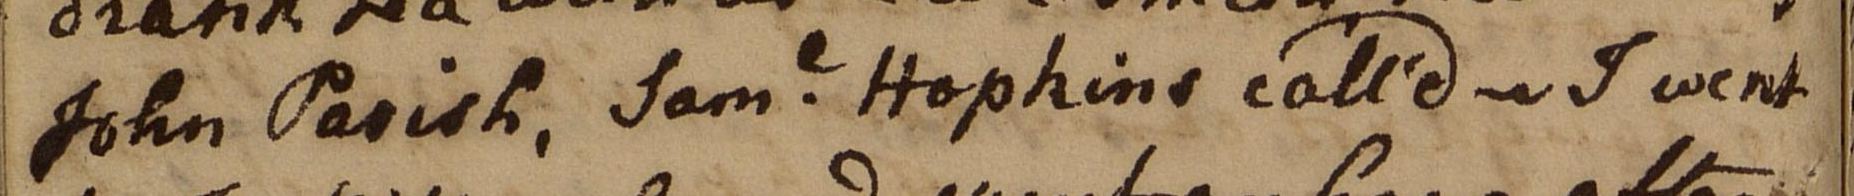John Parish, Sam^l. Hopkins call'd- I went
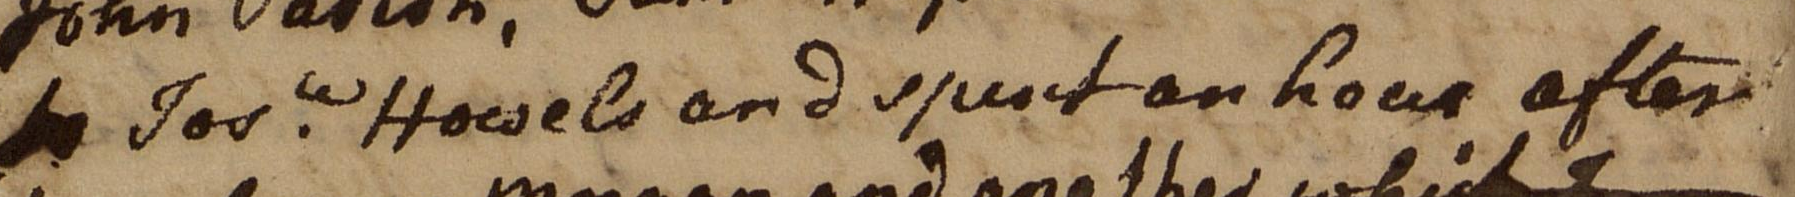to Jos^a. Howels and spent an hour after
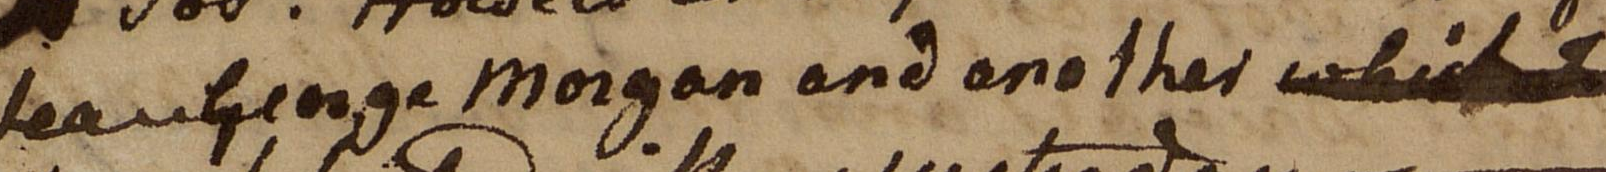tea- Ginge Morgan and another which I
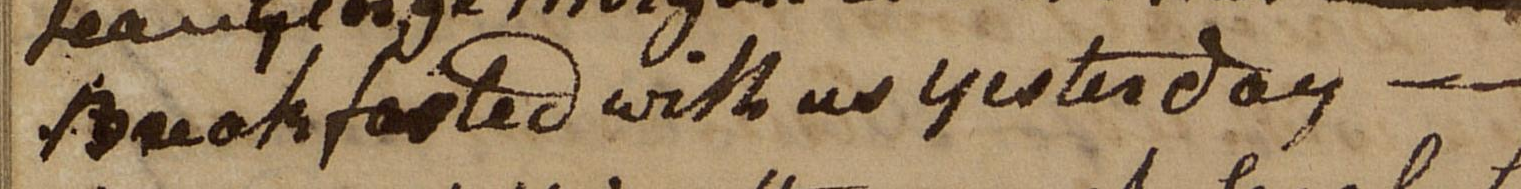Breakfasted with us yesterday-
